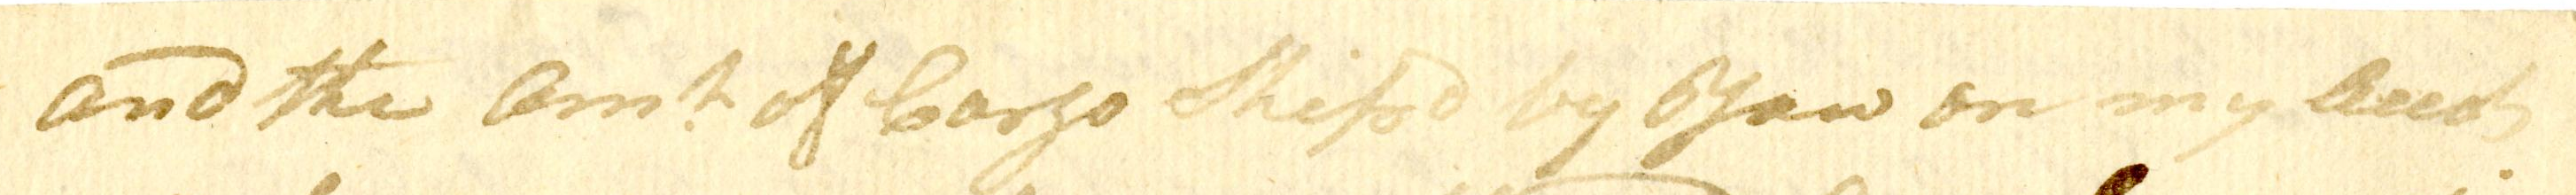and the am^t. of Cargo Ship^d by you on my Acco^t
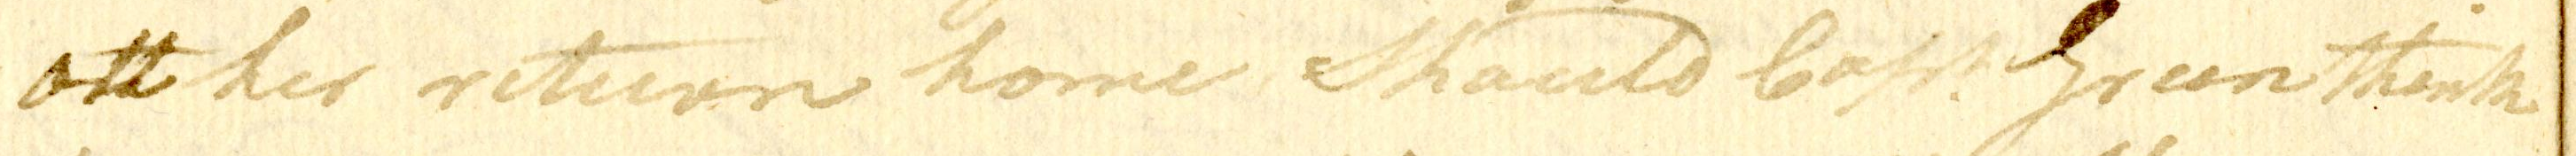att her return home Should Cap^t. Green think
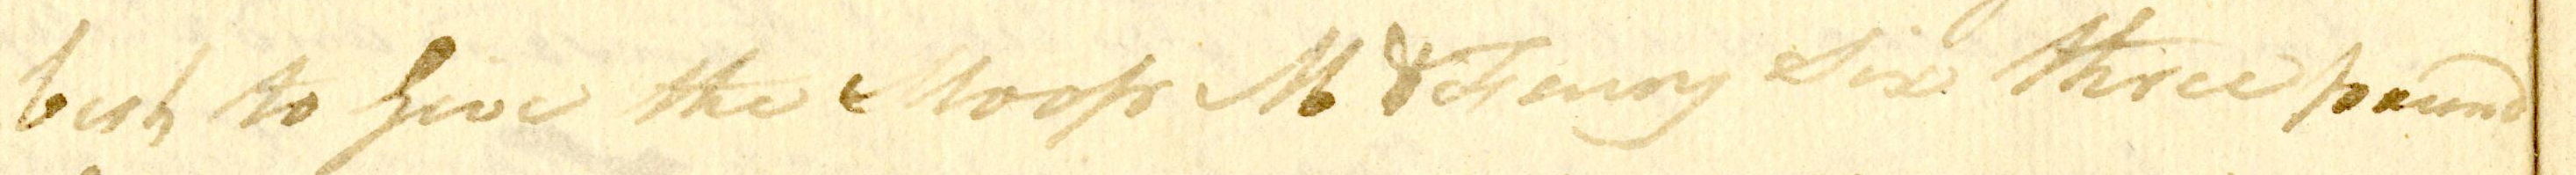best, to give the Sloop M & Fanny Six Three pound
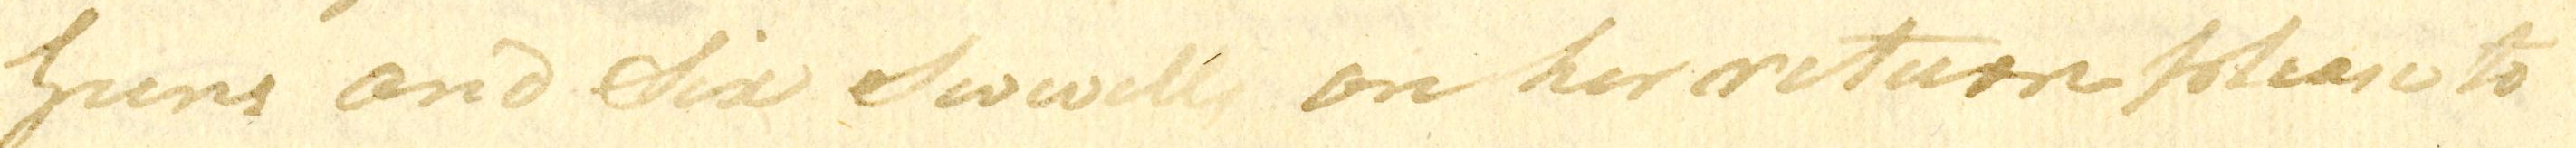Grens and Six swwells on her return please to
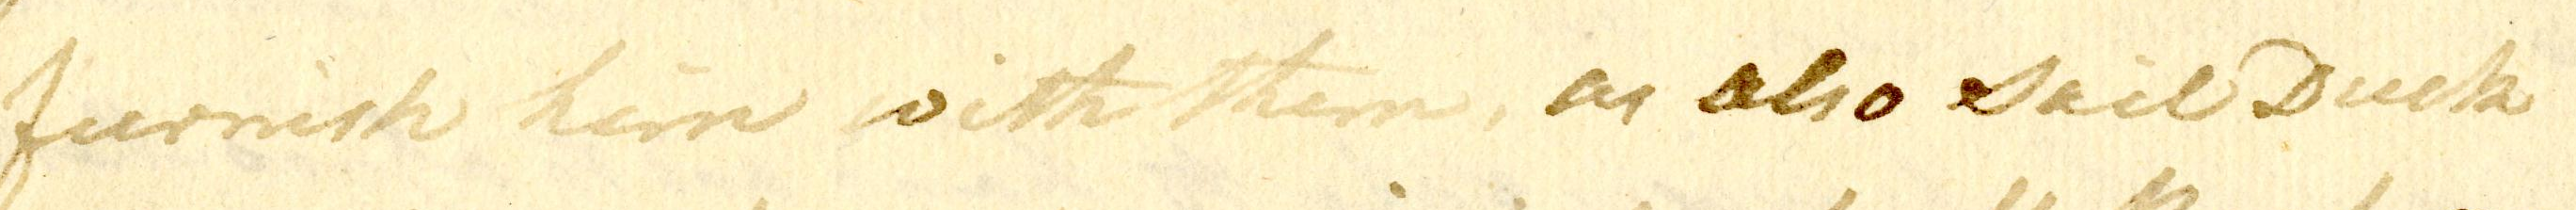furnish him with them, as also sail duck
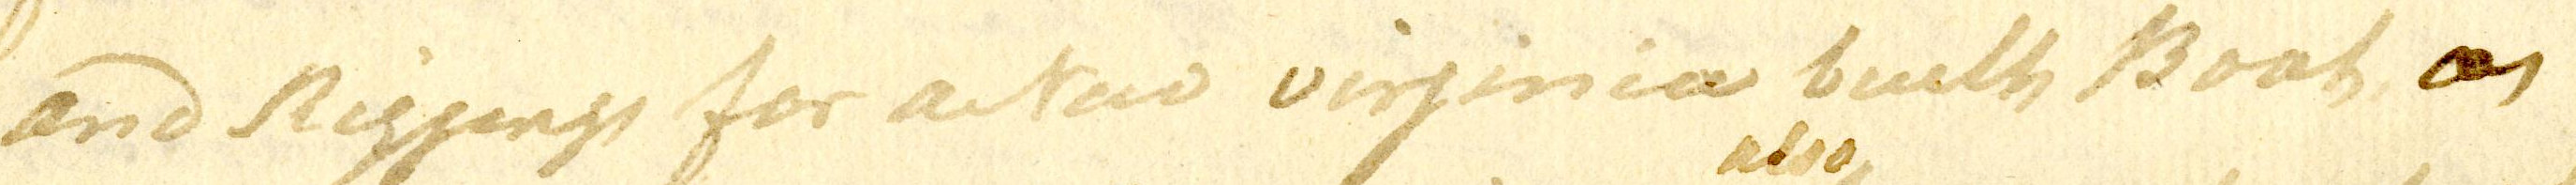and Riggings for a new Virginia built Boat as
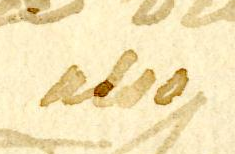also
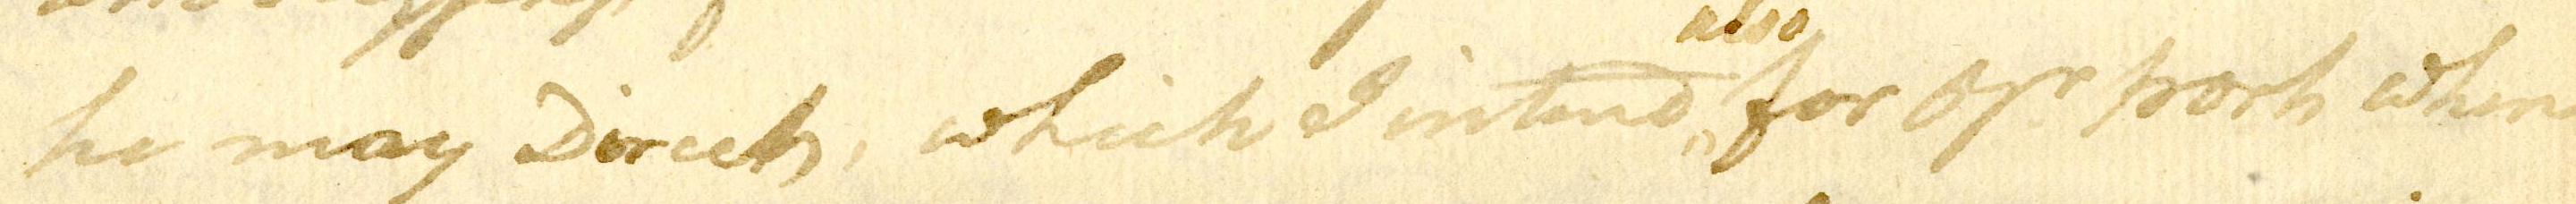he may Direct, which I intend ^ for your post when
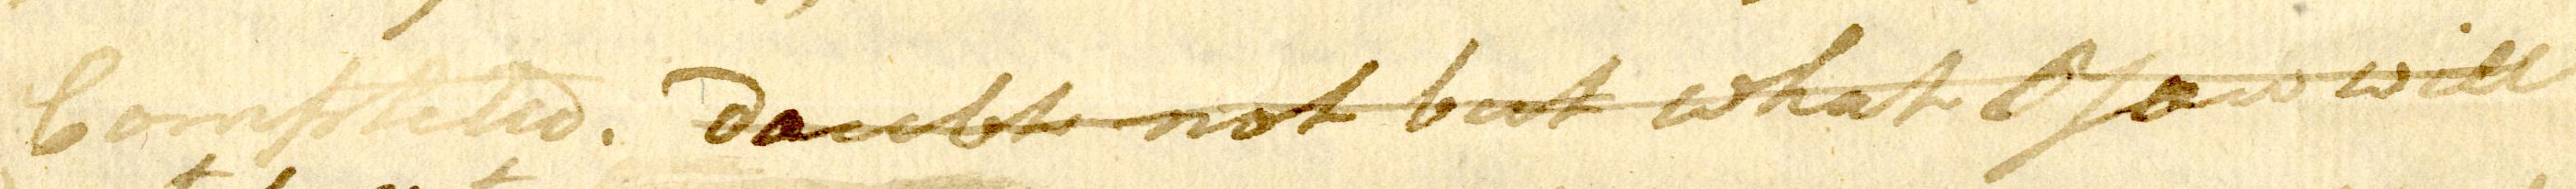Completed. [doubt not but what you will]
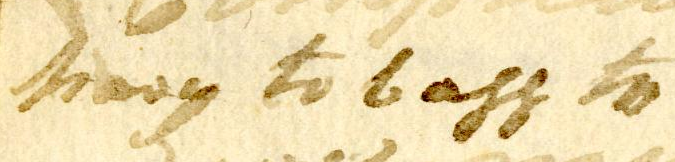havg to bagg to
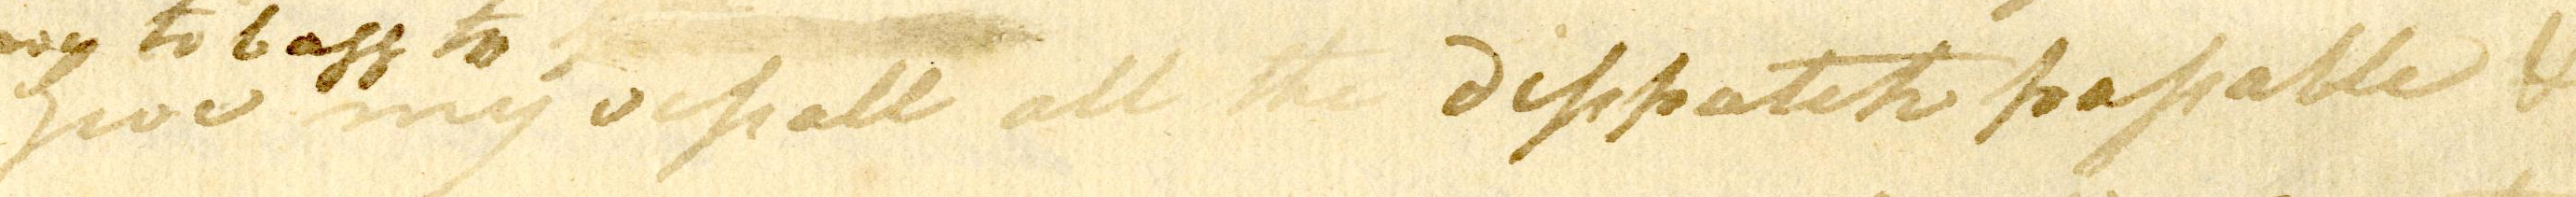give my vessall all the disspatch possable &
